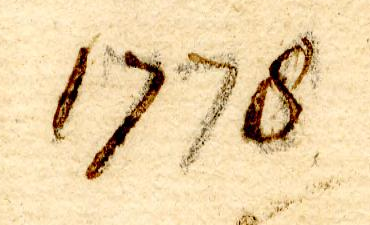1778
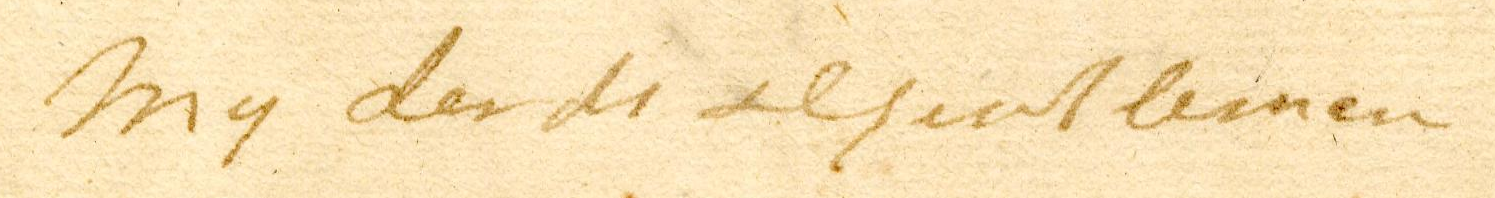My Lords & gentlemen
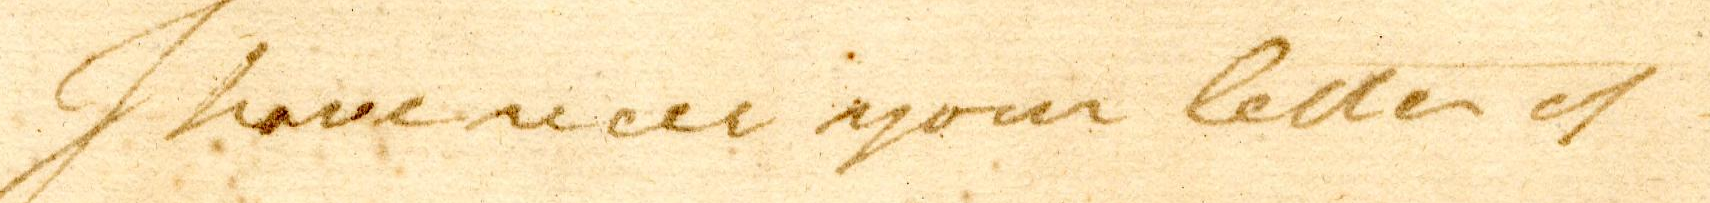I have recei your letter of
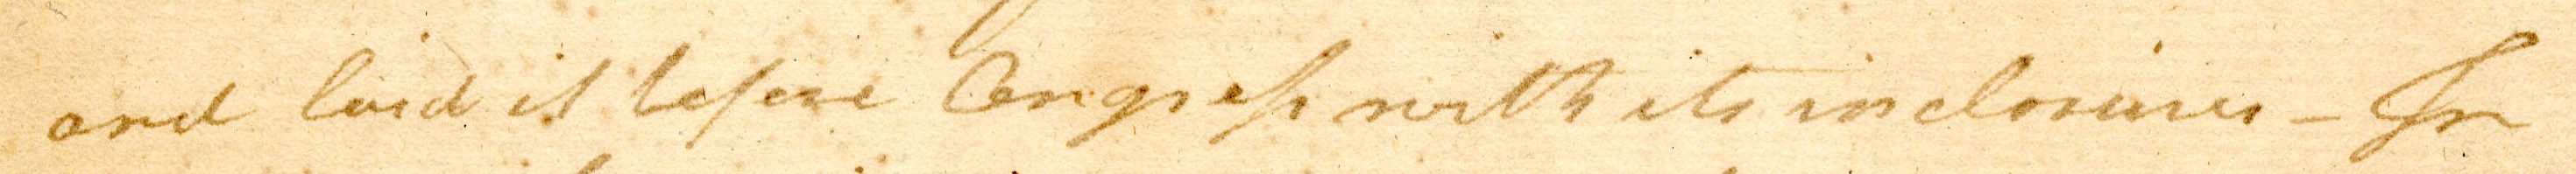and laid it before Congress wild its inclosures- In
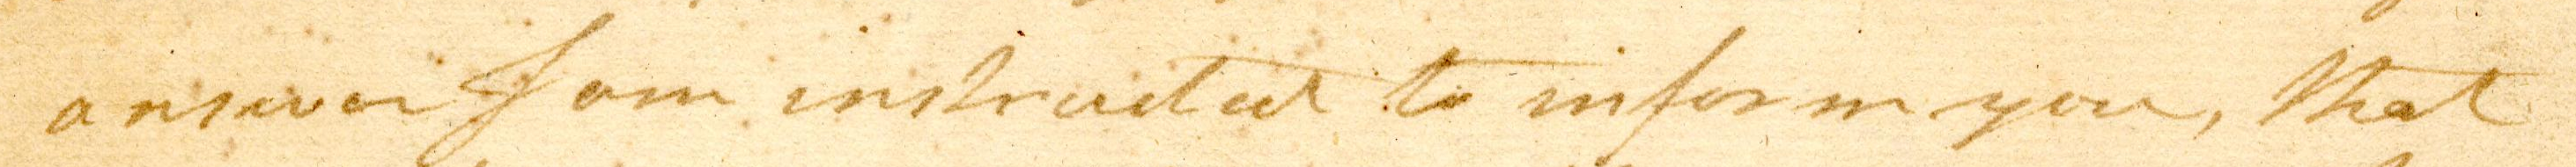answer I am instructed to inform you, that
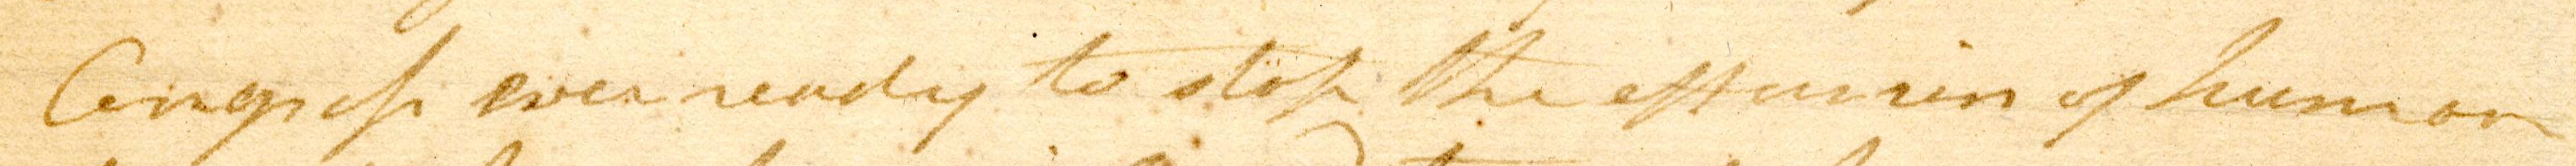Congress ever ready to stop the effusion of human
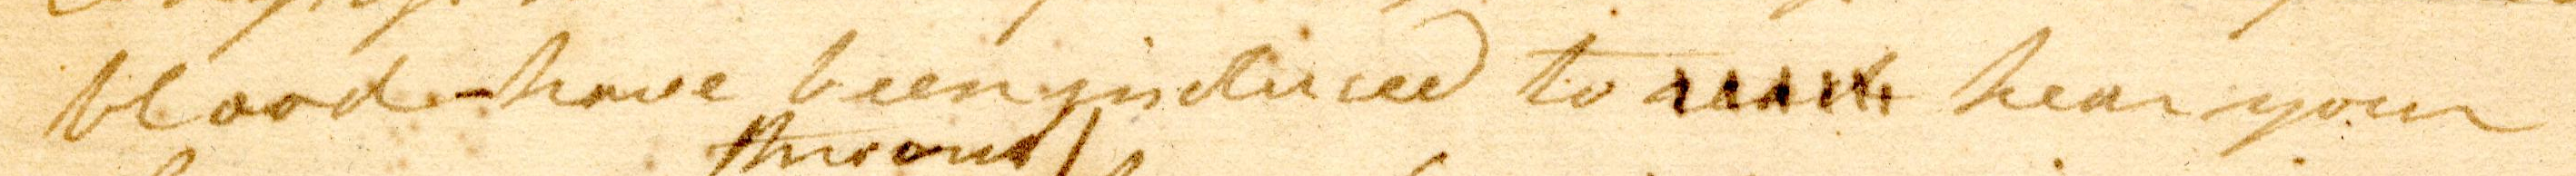blood have been induced to [reach] hear your
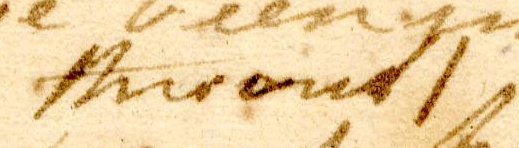through
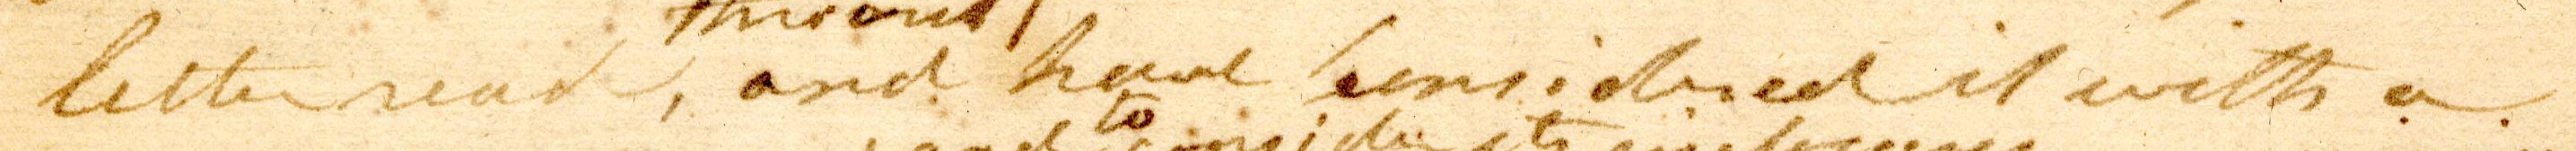letter read ^ and have pensidbrecl it with a
